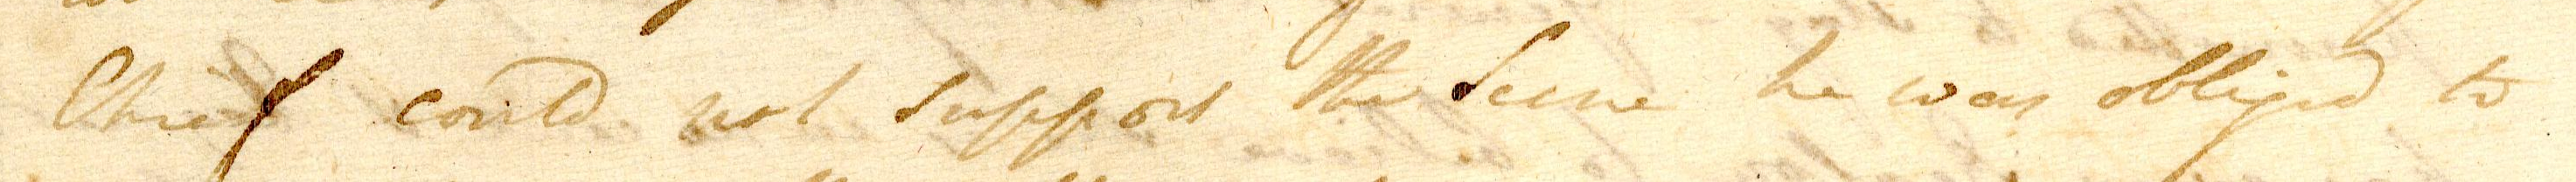Chief could not support the scene he was obliged to
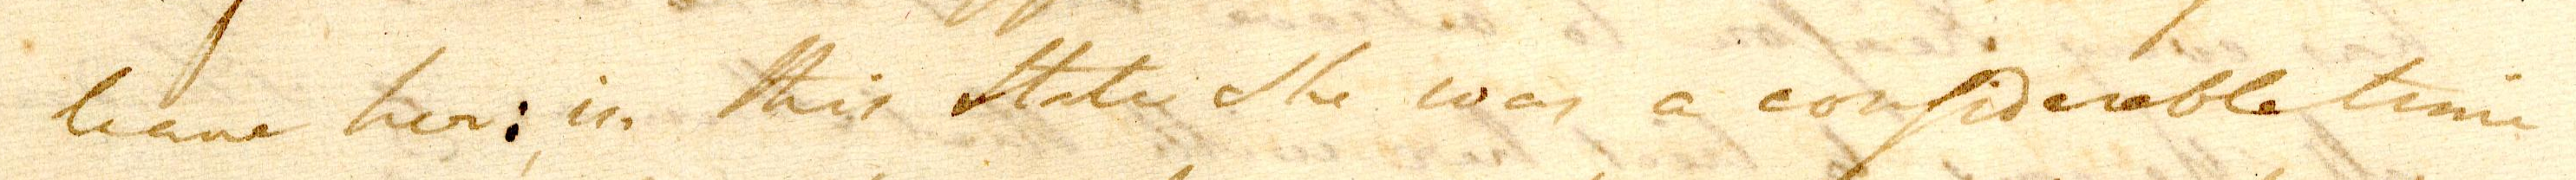leave her; in this state She was a considerable time
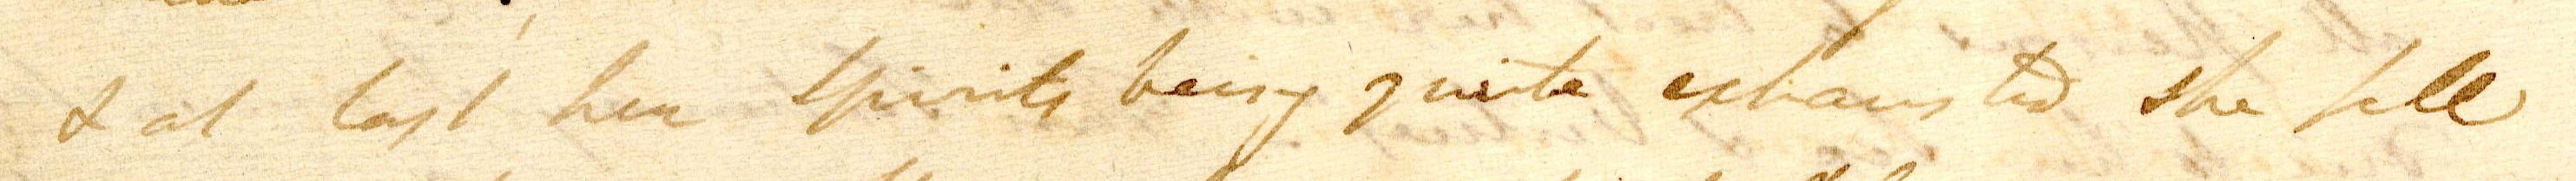& at last her Spirits being quite exhausted she fell
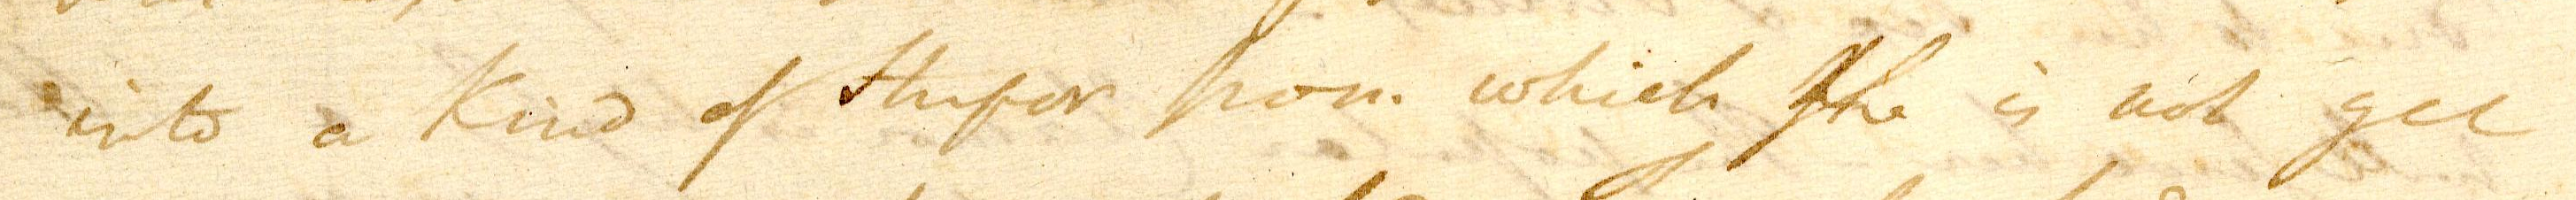into a kind of Stupor from which she is not yet
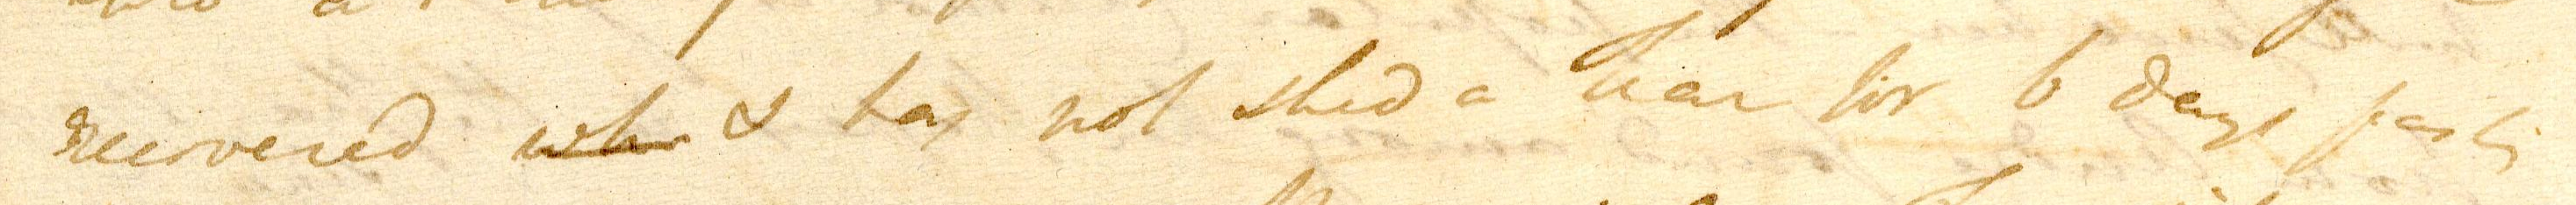recovered wh & has not shed a tear for 6 days past
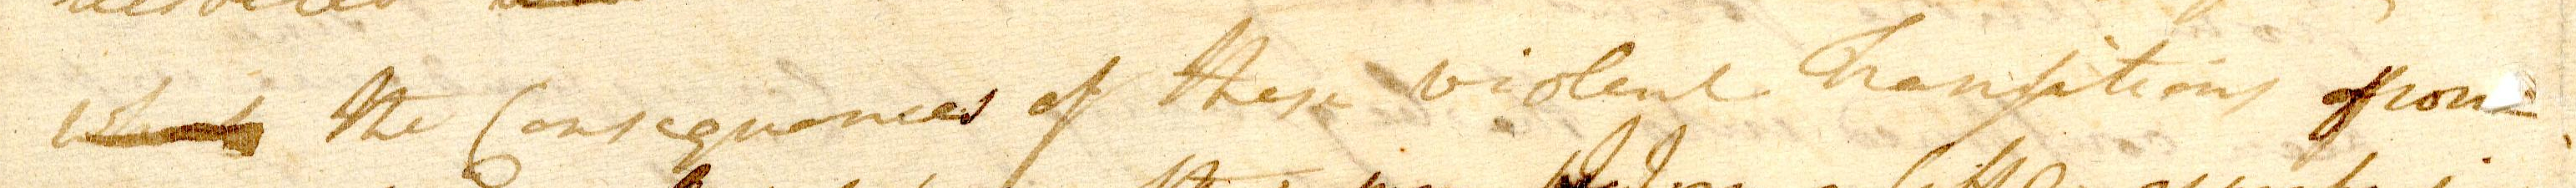which the Consequences of these violent Transitions ofron-
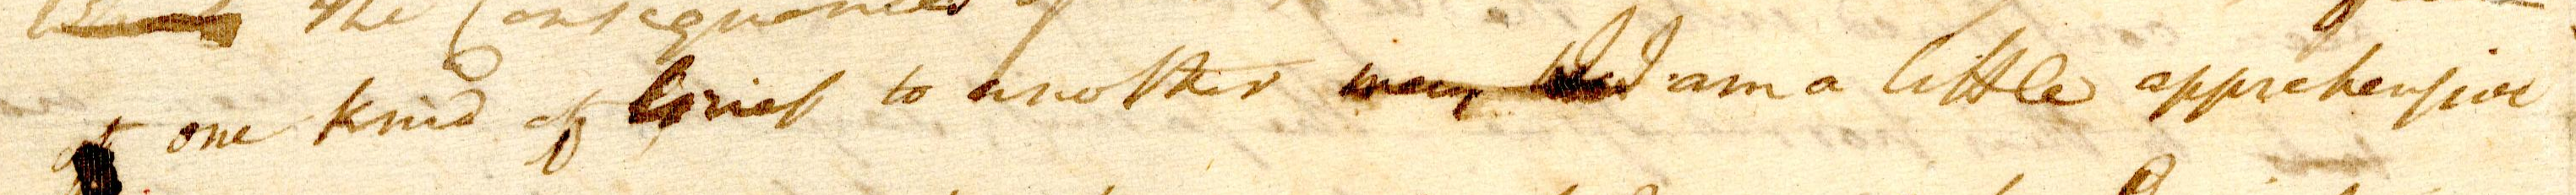it one kind of Grief to another may I am a little apprehensive
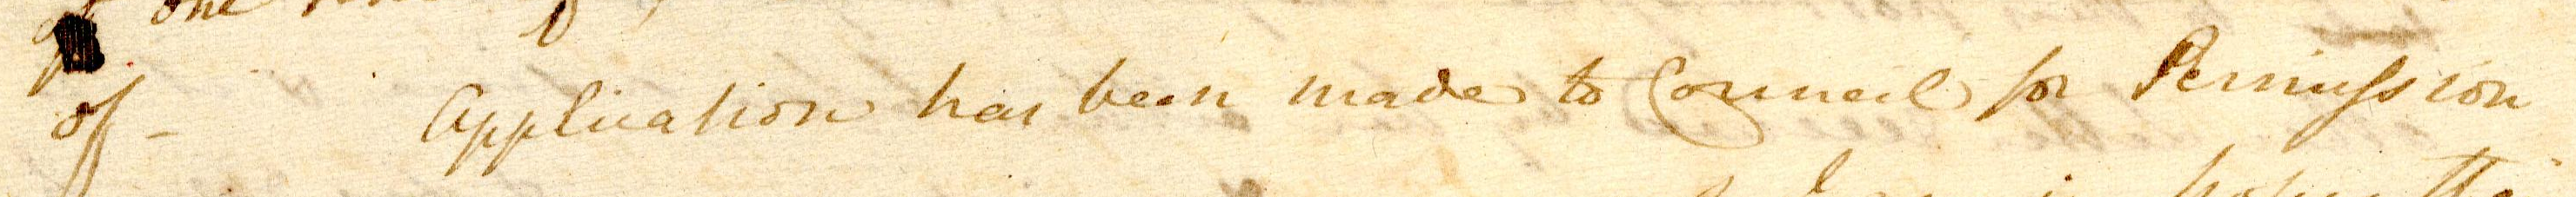of. Application has been made to Council for Pennission
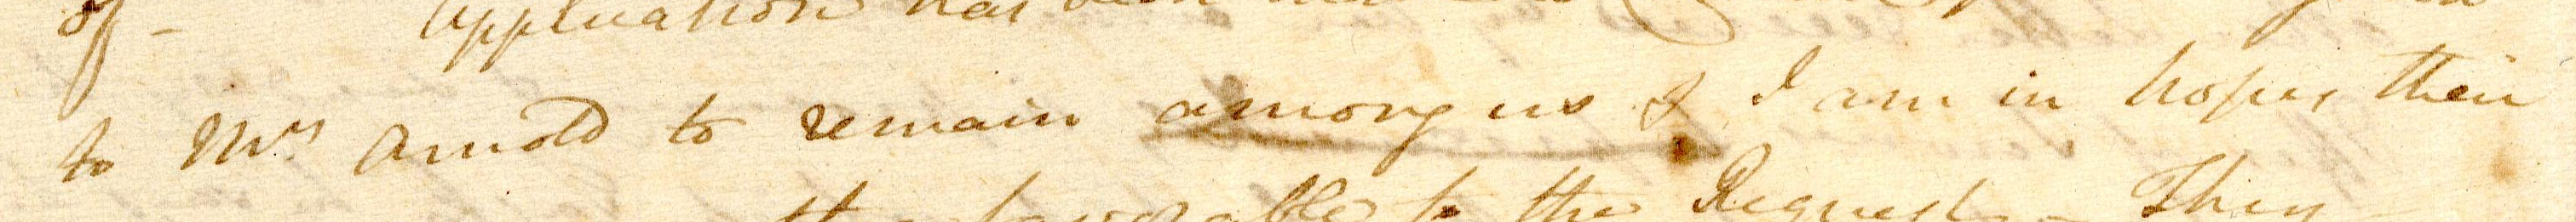to M^rs. Arnold to remain among us & I am in hopes their
